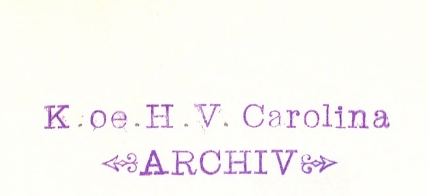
K.oe.H.V. Carolina
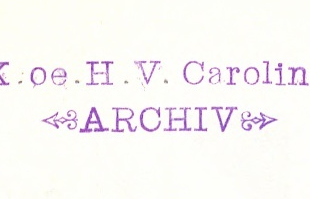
ARCHIV
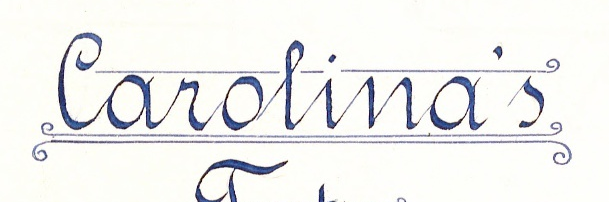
Carolina's
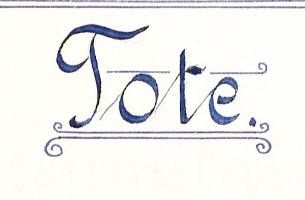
Tote
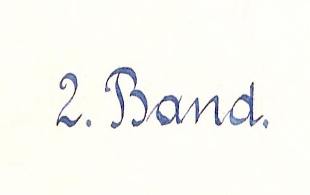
2. Band
